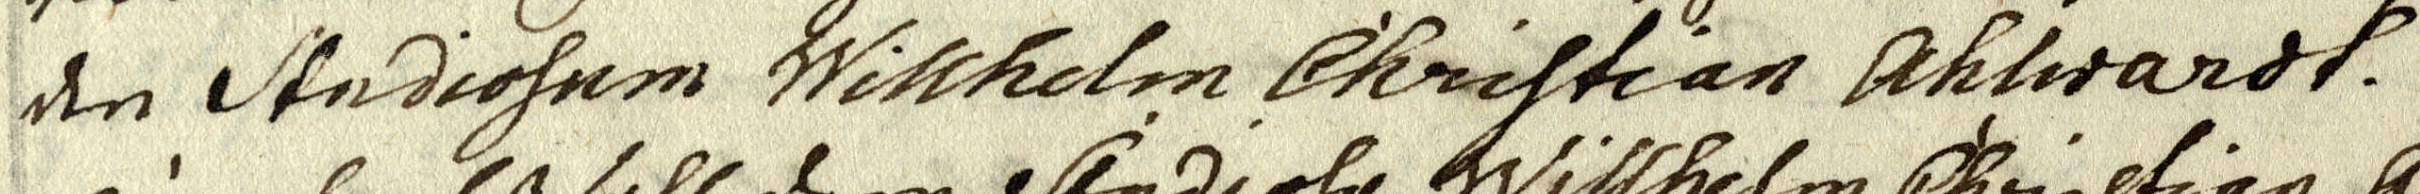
den Studiosum Willhelm Christian Ahlwardt.
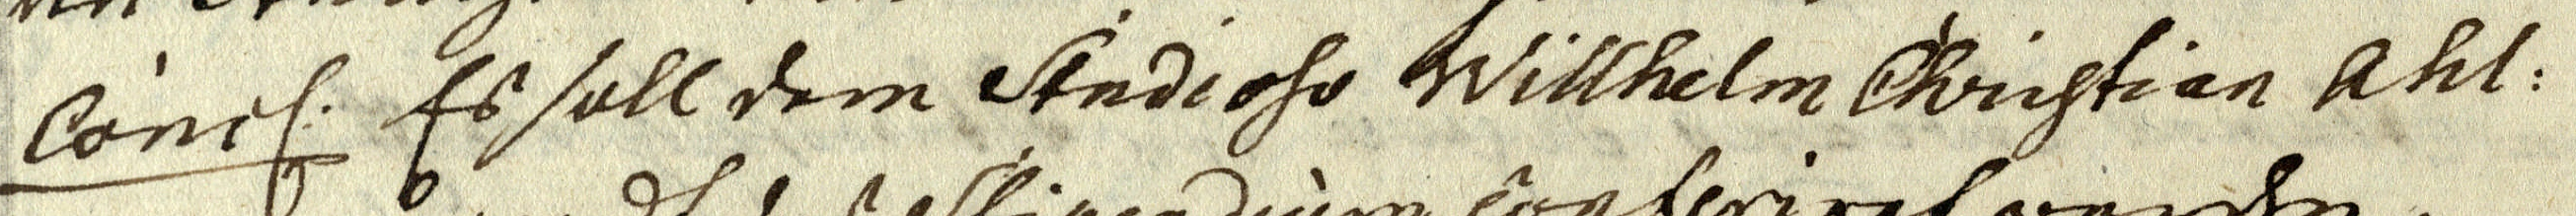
Concl. Es soll dem Studioso Willhelm Christian Ahl¬
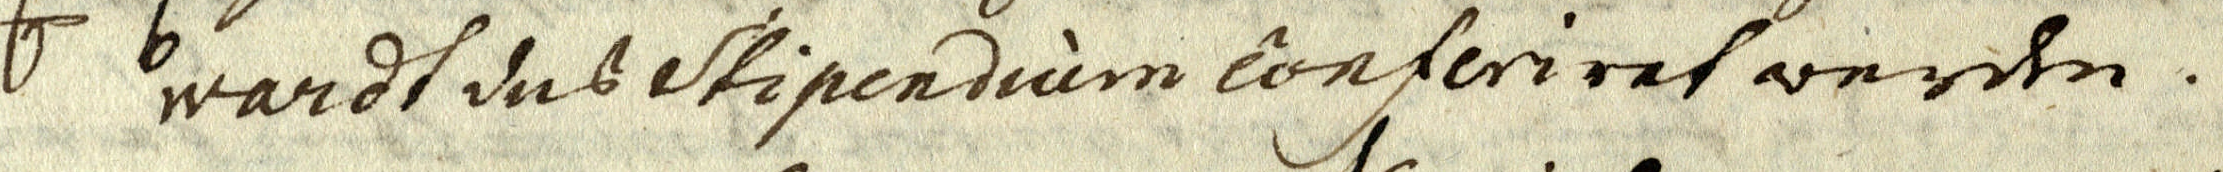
wardt das Stipendium conferiret werden.
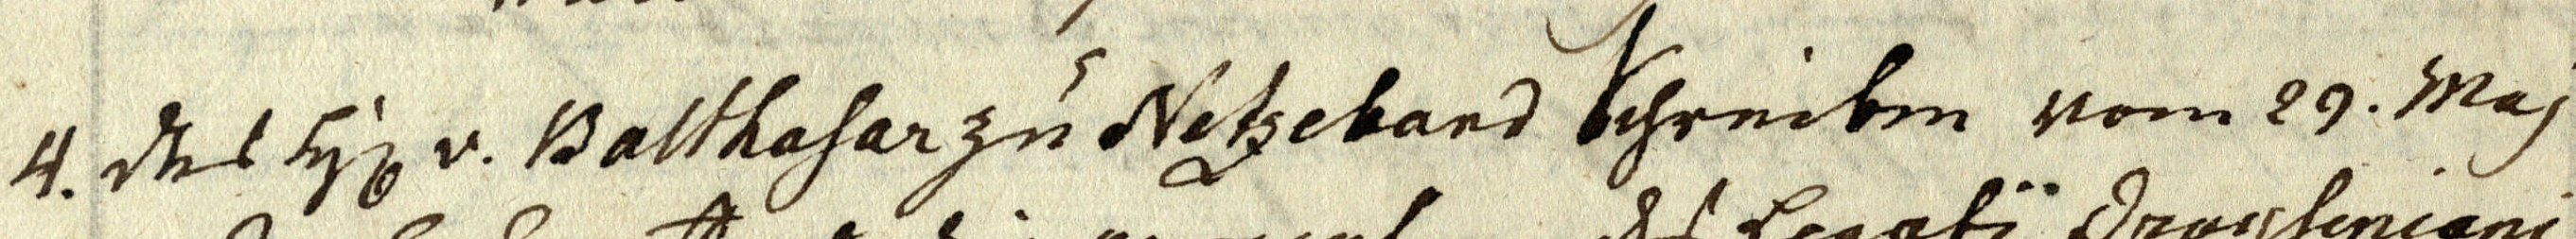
4. Des h. v. Barlthasar zu Netzeband Schreiben vom 29. Maj
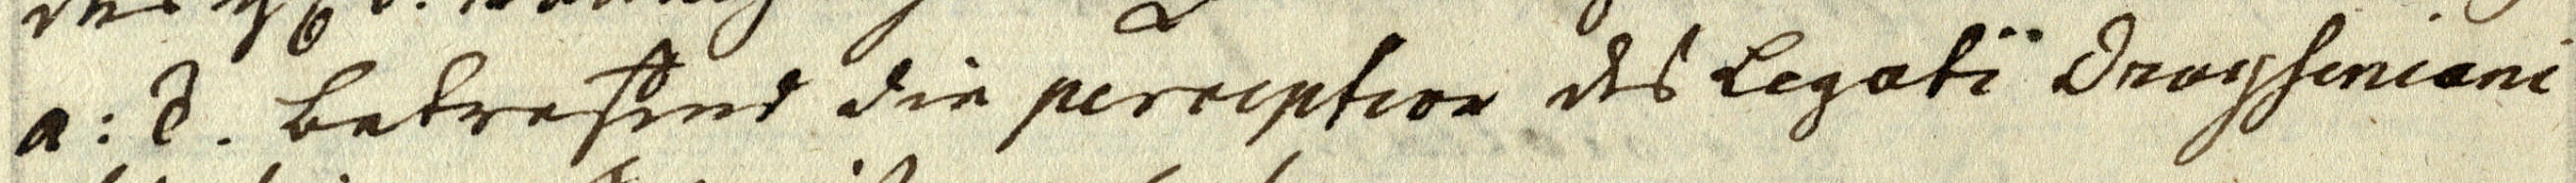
a. d. betreffend die perception des Legati Droyseniani
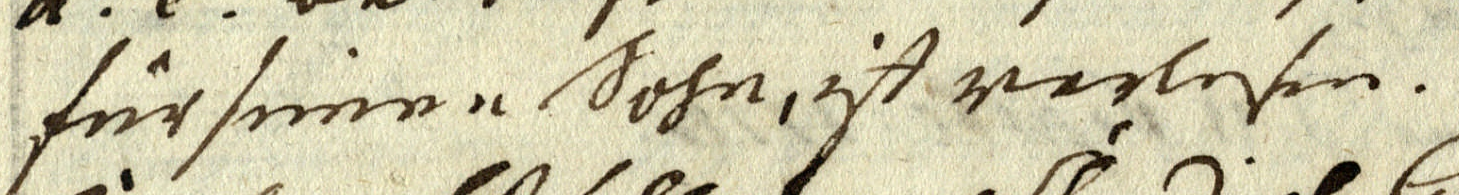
für seinen Sohn, ist verlesen.
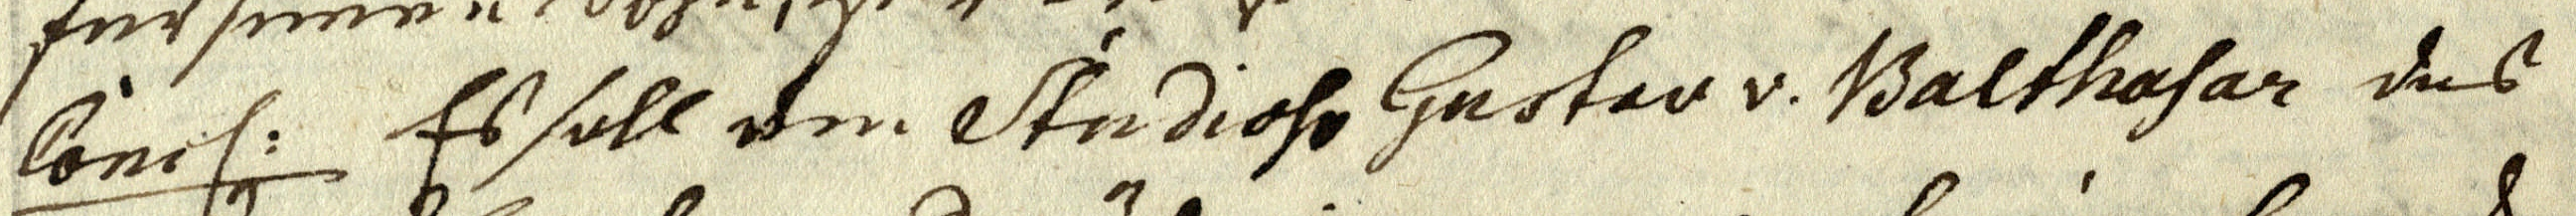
Concl. Es soll dem Studioso Gustav v. Balthasar das
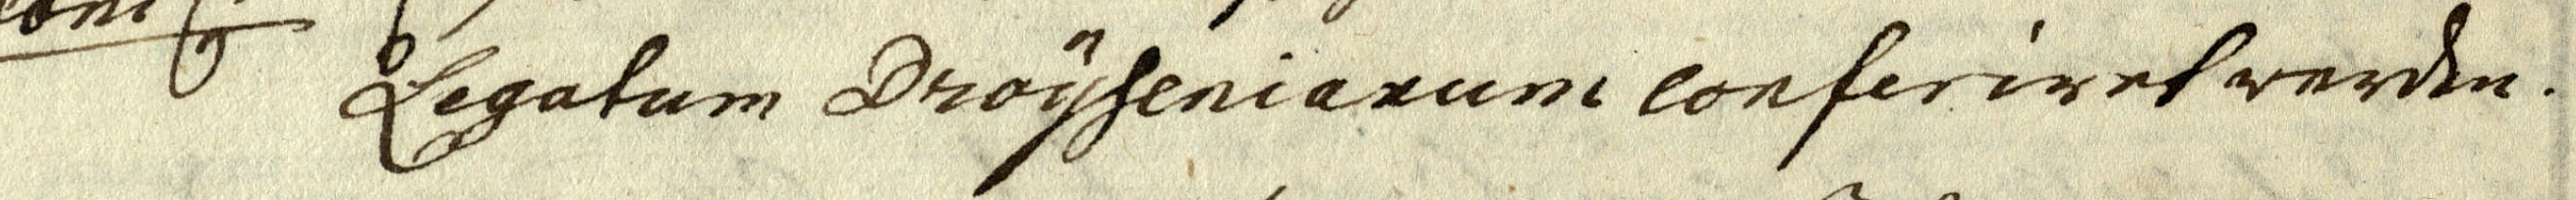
Legatum Droÿsenianum conferiret werden.
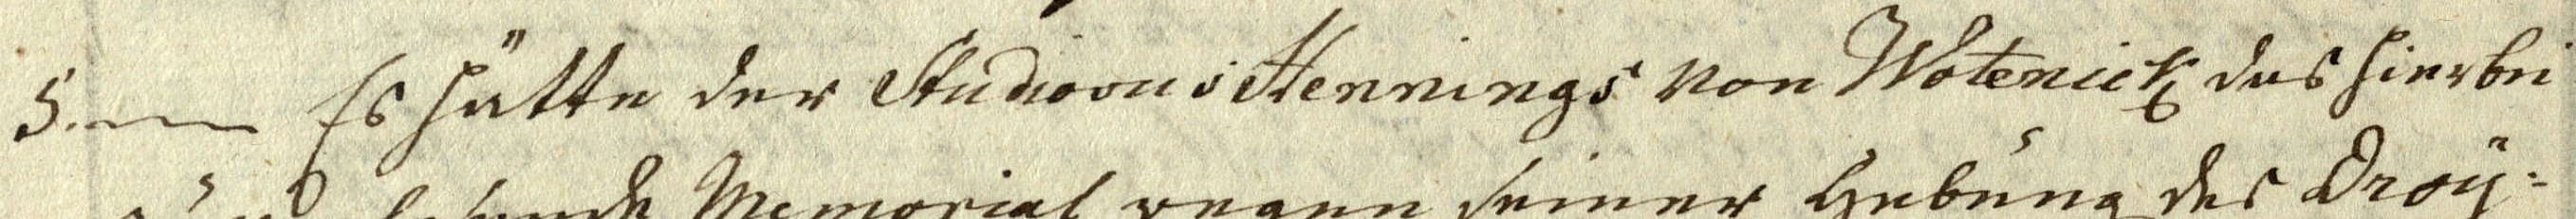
Es hätte der Studiosus Hennings von Wotenick das hierbei
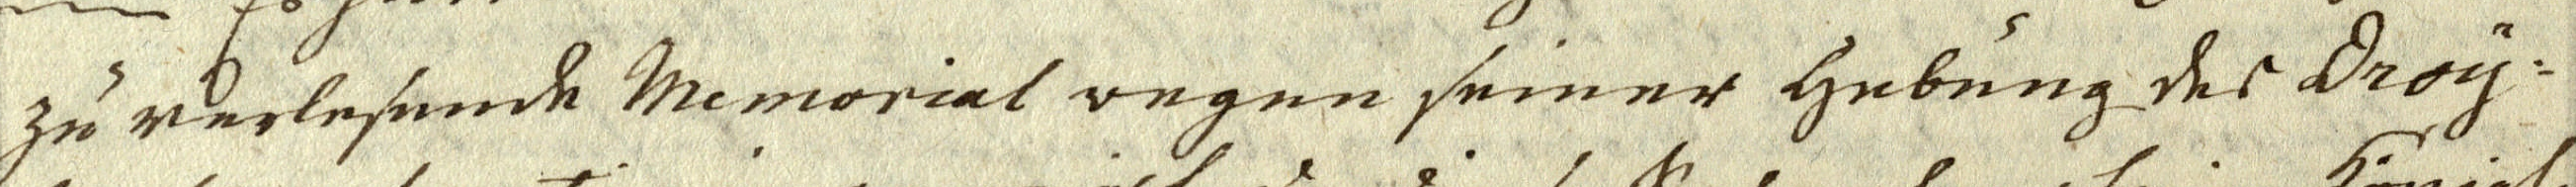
zu verlesende Memorial wegen seiner Hebung des Droÿ¬
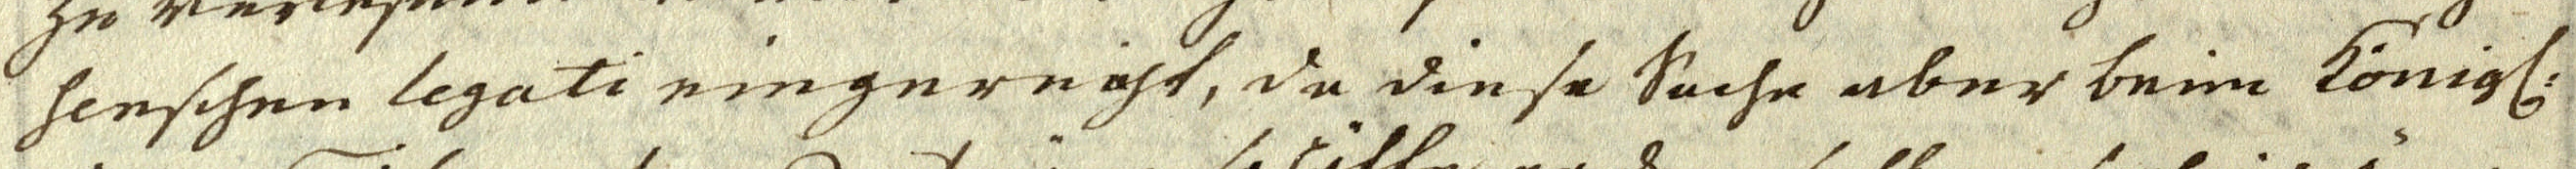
senschen legati eingereicht, da diese Sache aber beim Königl.
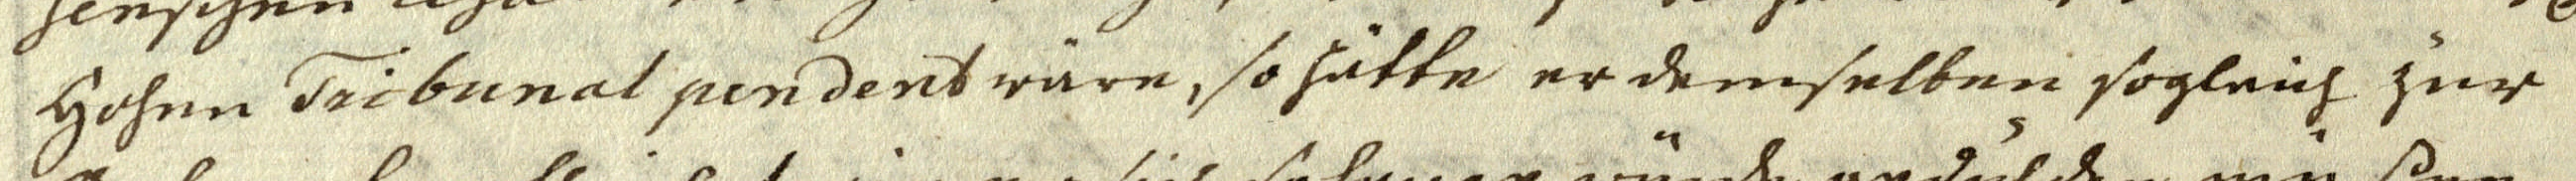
Hohen Tribunal pendent wäre, so hätte er demselben sogleich zur
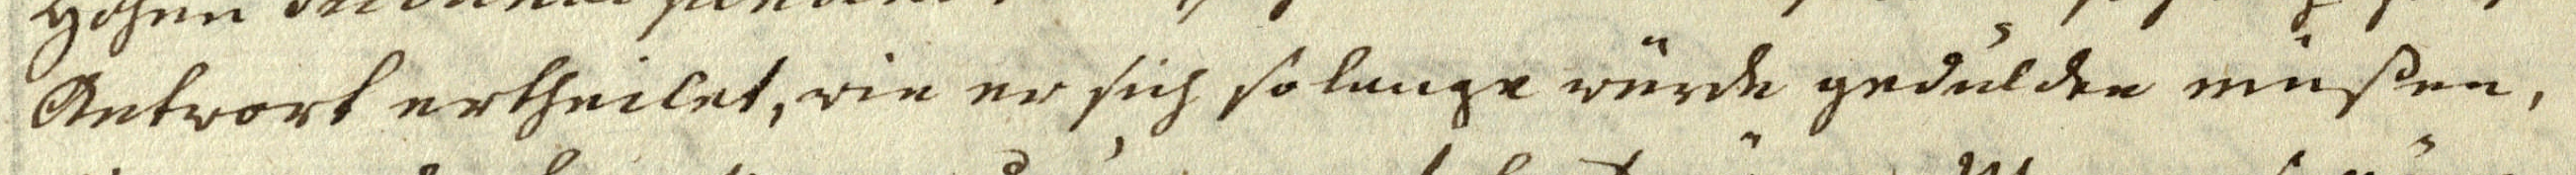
Antwort ertheilet, wie er sich so lange würde gedulden müßen,
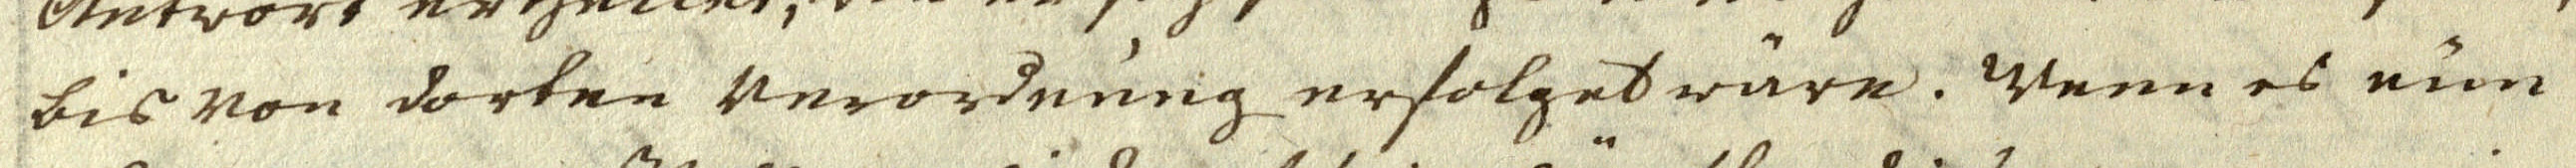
bis von dorten Verordnung erfolget wäre. Wenn es nun
